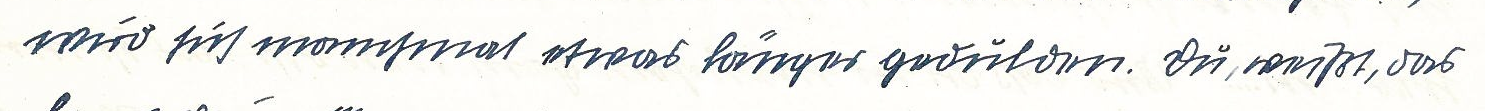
wird sich manchmal etwas länger gedulden. Du, weißt, das
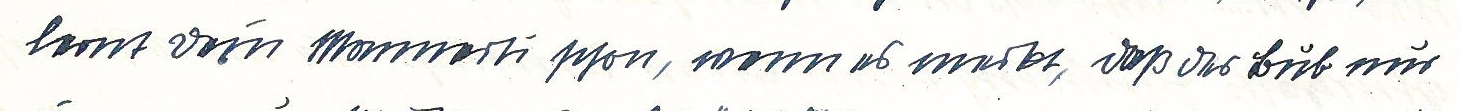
lernt Dein Mannerli schon, wenn es merkt, daß der Bub nur
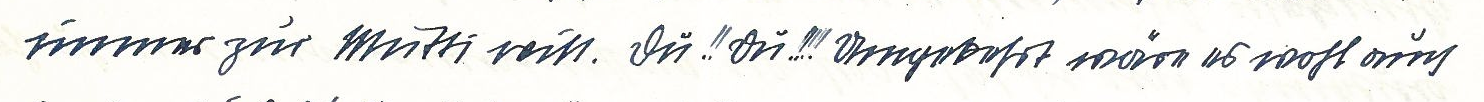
immer zur Mutti will. Du!! Du!!!! Umgekehrt wäre es wohl auch
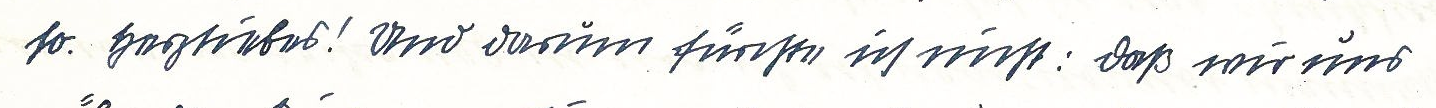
so. Herzliebes! Und darum fürchte ich nicht: daß wir uns
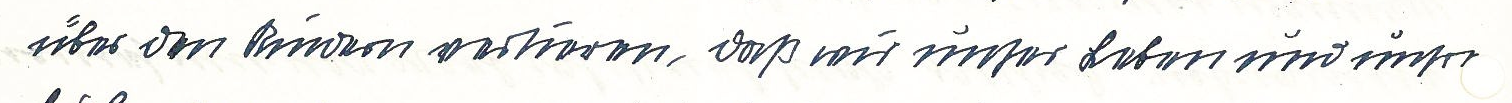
über den Kindern verlieren, daß wir unser Leben und unsre
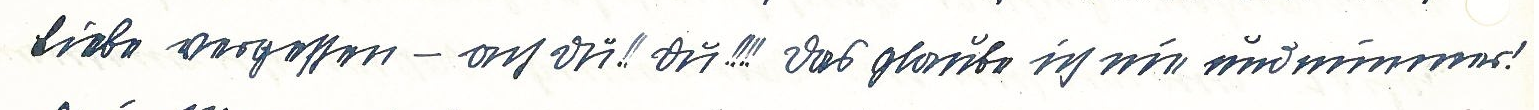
Liebe vergessen – ach Du!! Du!!! Das glaube ich nie und nimmer!
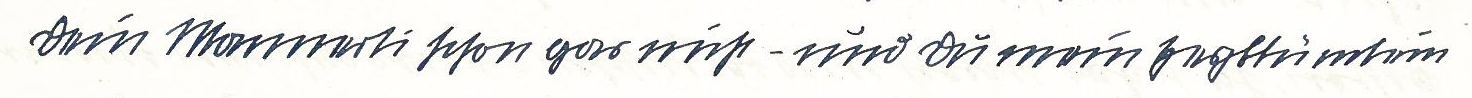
Dein Mannerli schon gar nicht – und Du mein Herzltümlein
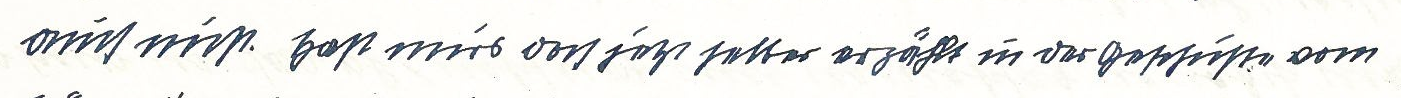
auch nicht. Hast mirs doch jetzt selber erzählt in der Geschichte vom
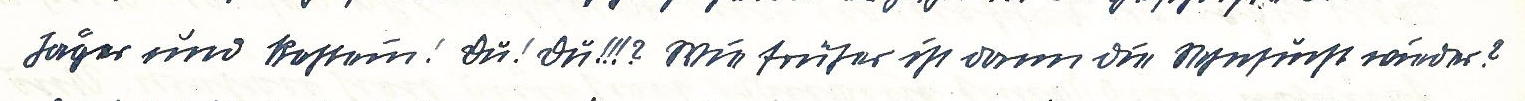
Jäger und Rehlein! Du! Du!!!? Wie früher ist dann die Sehnsucht wieder?
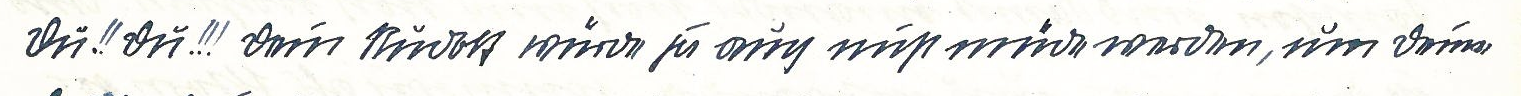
Du!! Du!!! Dein würde ja auch nicht müd werden, um Deine
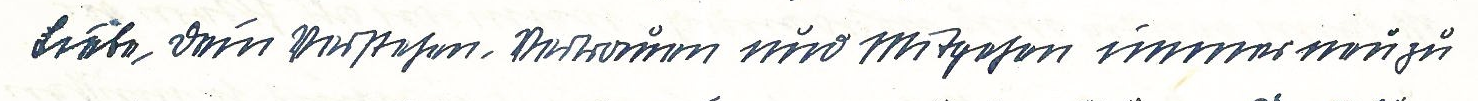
Liebe, Dein Verstehen, Vertrauen und Mitgehen immer neu zu
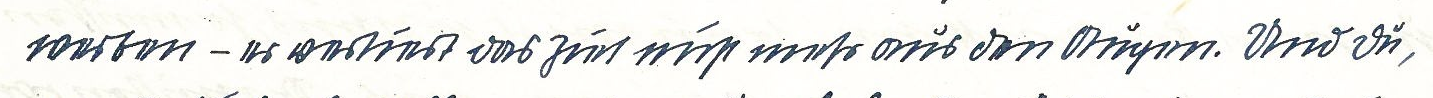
werten – er verliert das Ziel nicht mehr aus den Augen. Und Du,
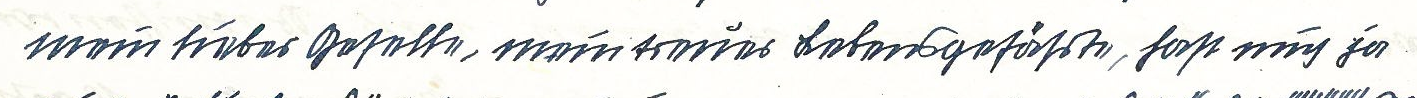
mein lieber Geselle, mein treuer Lebensgefährte, hast mich ja
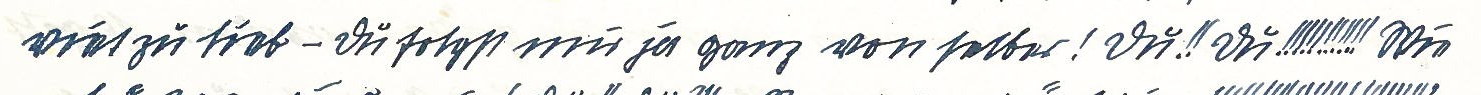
viel zu lieb – Du folgst mir ja ganz von selber! Du!! Du!!!!!!!!!!! Wie
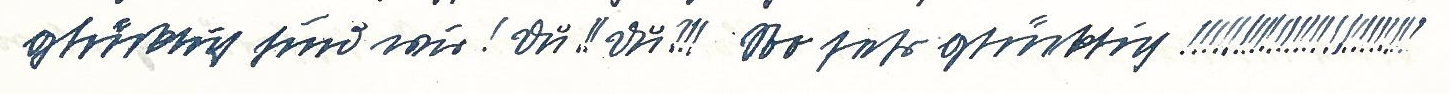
glücklich sind wir! Du!! Du!!!! So sehr glücklich!!!!!!!!!!!!!!!!!!!!!!!!!
